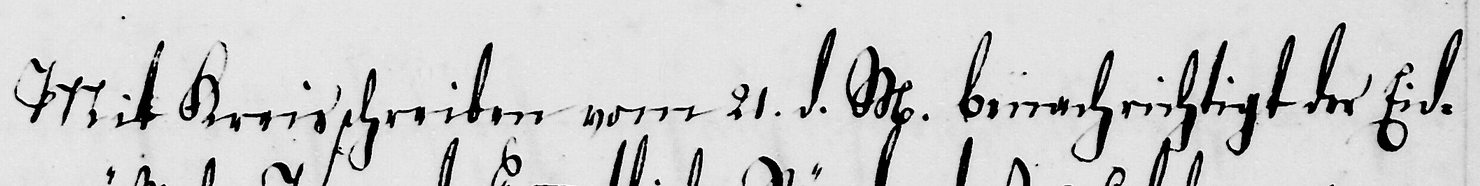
Mit Kreisschreiben vom 21. d. M. benachrichtigt der Eid¬
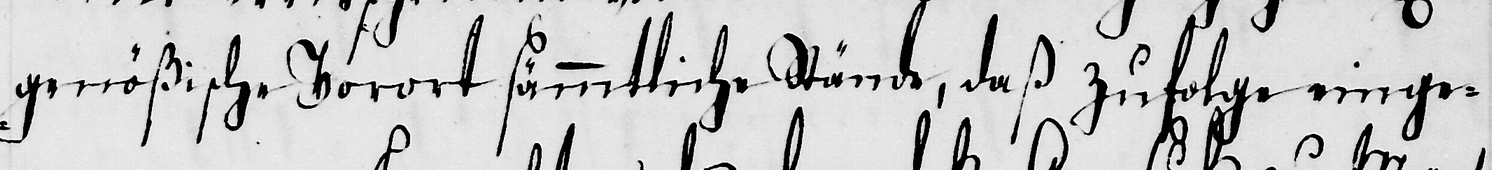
genößische Vorort sämmtliche Stände, daß zufolge einge¬
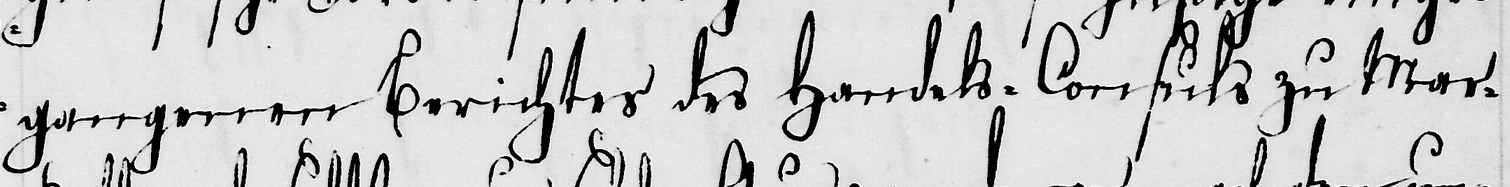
gangenen Berichtes des Handels-Consuls zu Mar¬
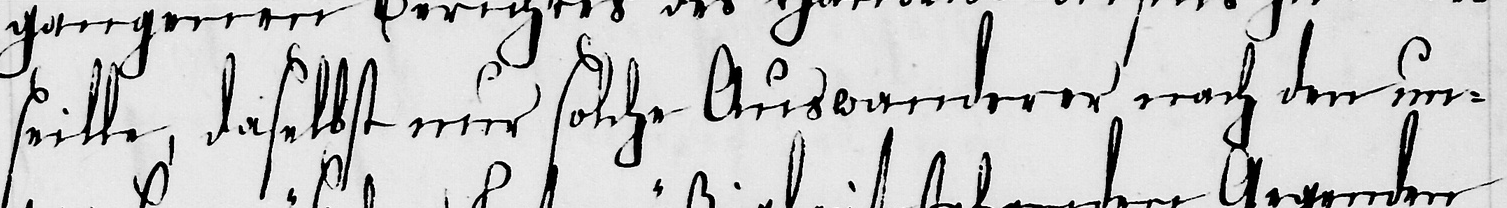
seille, daselbst nur solche Auswanderer nach den un¬
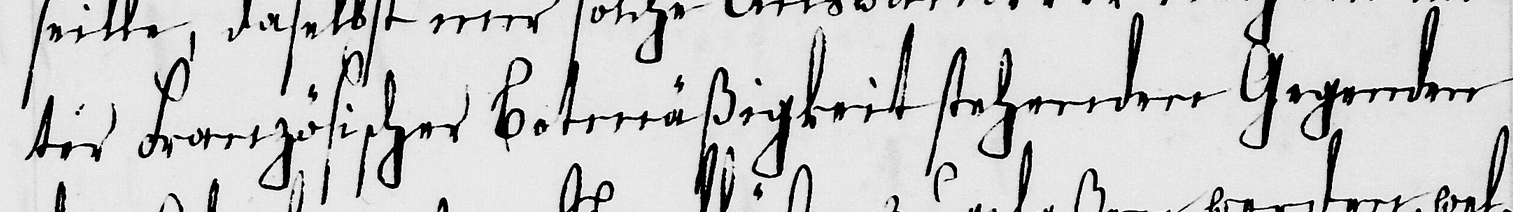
ter Französischer Botmäßigkeit stehenden Gegenden
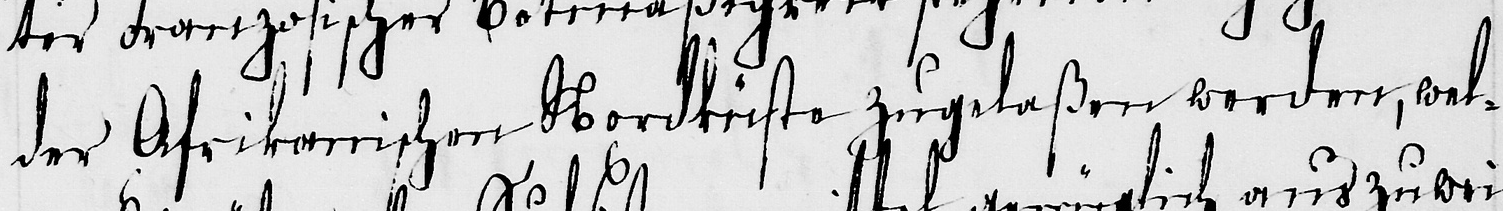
der Afrikanischen Nordküste zugelaßen werden, wel¬
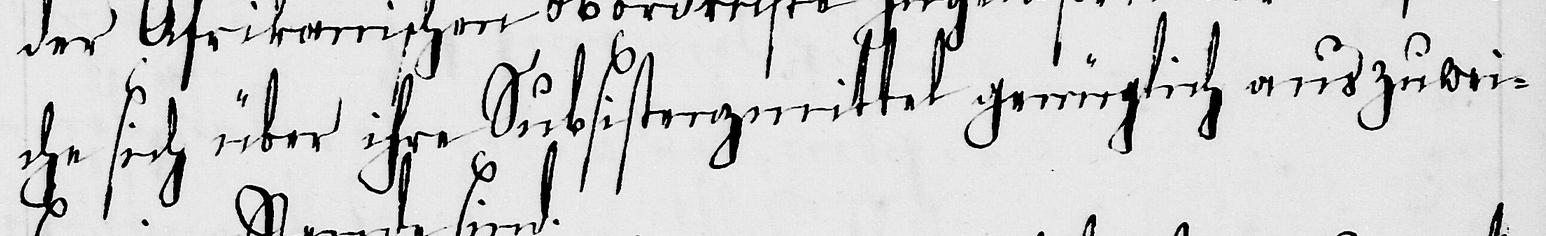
che sich über ihre Subsistenzmittel genüglich auszuwei¬
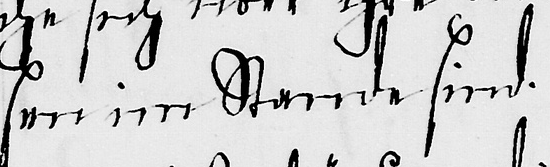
sen im Stande sind.
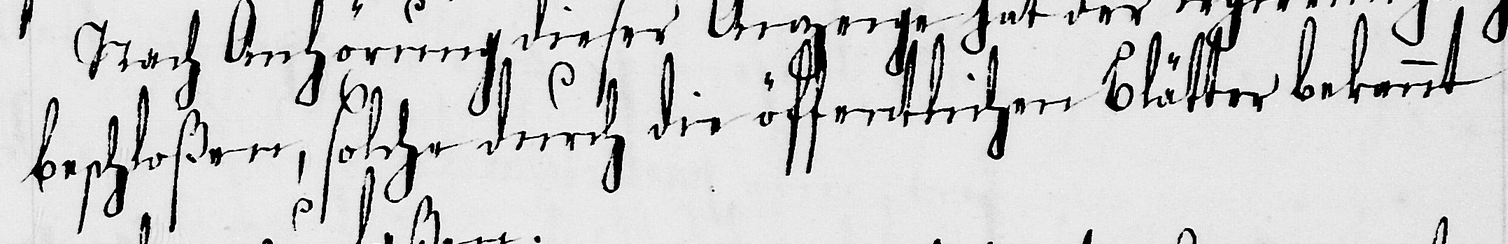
beschloßen, solche durch die öffentlichen Blätter bekannt
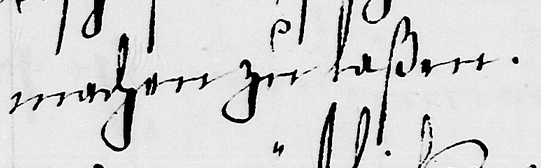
machen zu laßen.
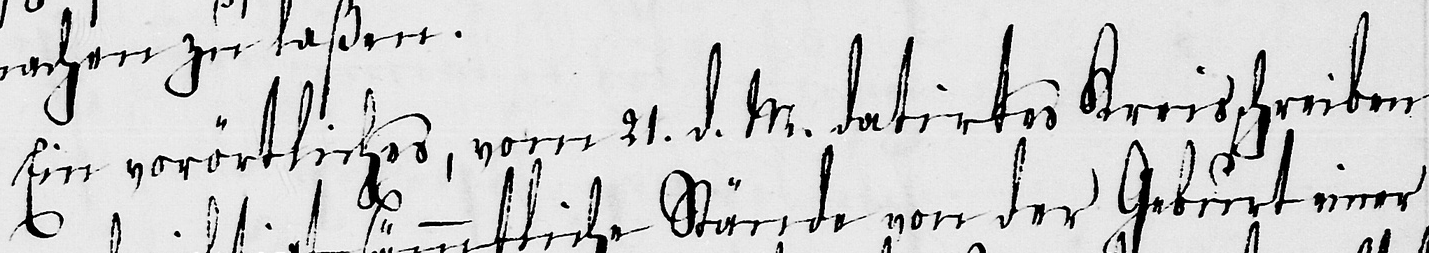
Ein vorörtliches, vom 21. d. M. datirtes Kreisschreiben
